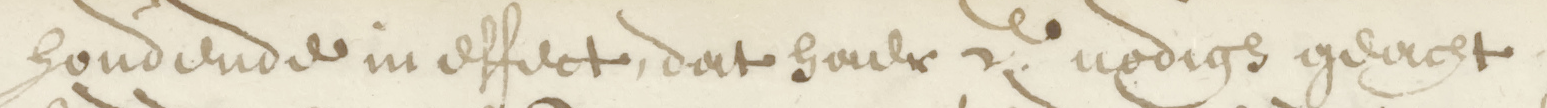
houdende in effect, dat haer E. nodigh geacht
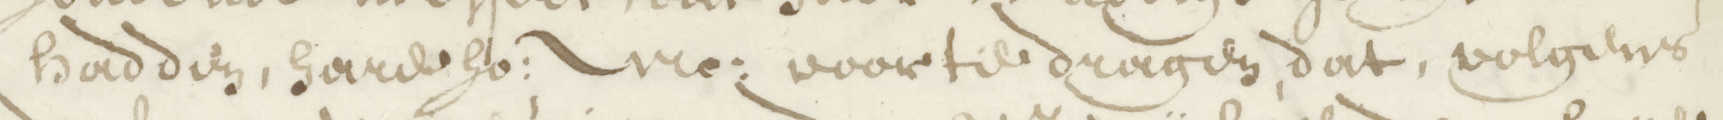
hadden, hare Ho:Mo: voor te dragen, dat, volgens
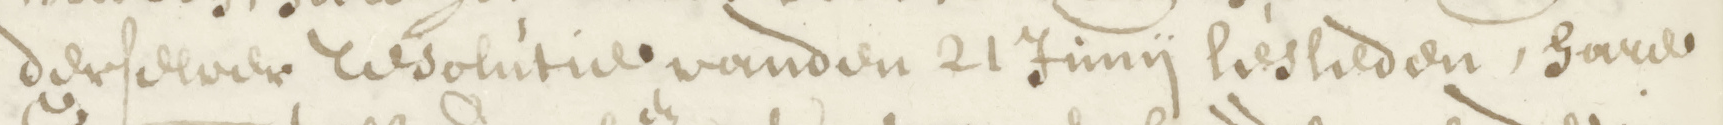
derselver resolutie vanden 21 Junij lesleden, hare
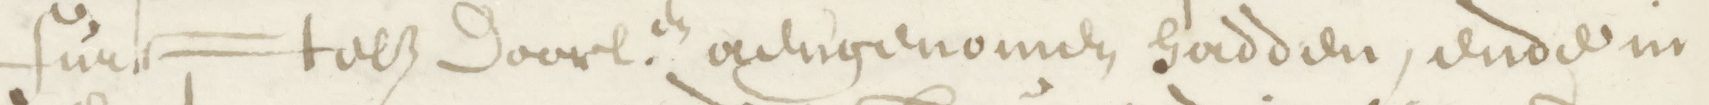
Furstel. Doorl.e aengenomen hadden, ende in
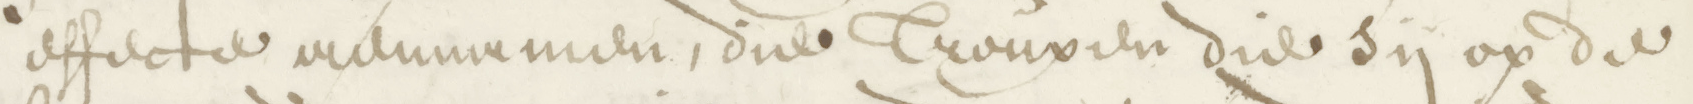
effecte aennamen, die Troupen die sij op de
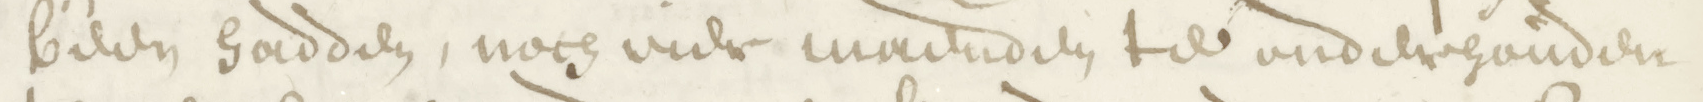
been hadden, noch vier maenden te onderhouden
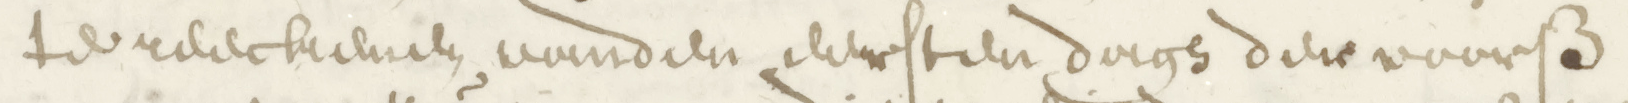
te reeckenen vanden eersten dagh der voors
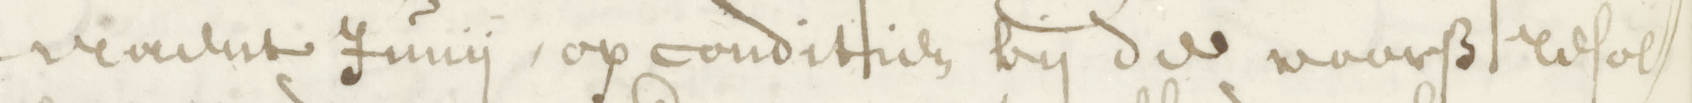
maent Junij, op conditien bij de voors resol
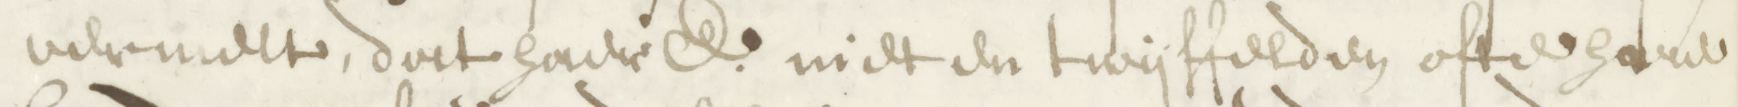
vermelt, dat haer E. niet en twijffelden ofte hare
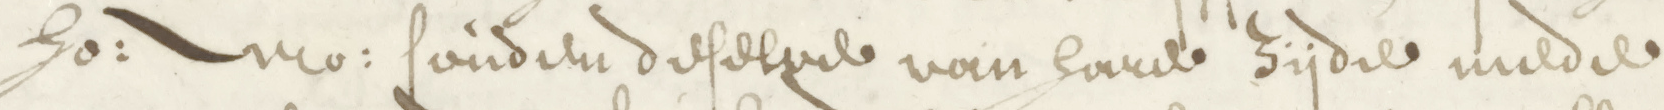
Ho:Mo: souden deselve van hare zijde mede
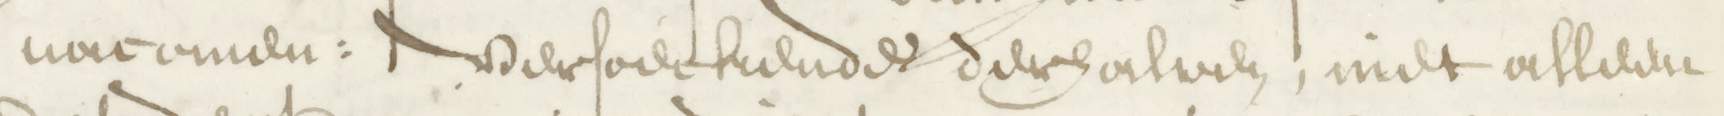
nacomen: Versoeckende derhalven, niet alleen
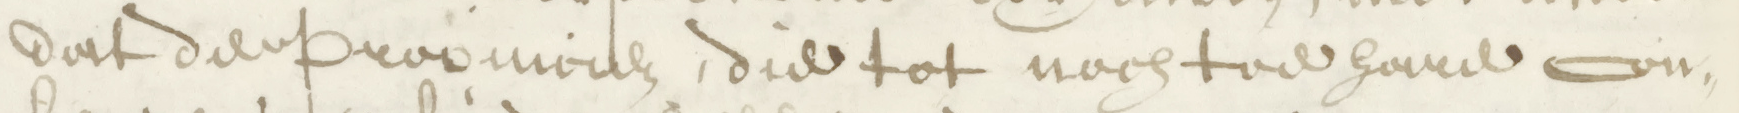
dat de provincien, die tot noch toe hare con„
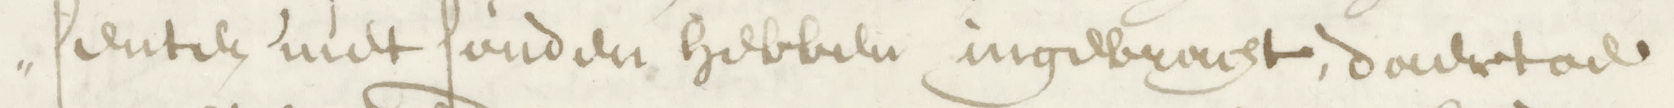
,,senten niet souden hebben ingebracht, daertoe
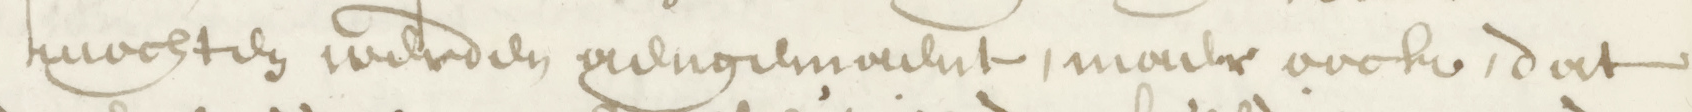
mochten werden aengemaent, maer oock, dat
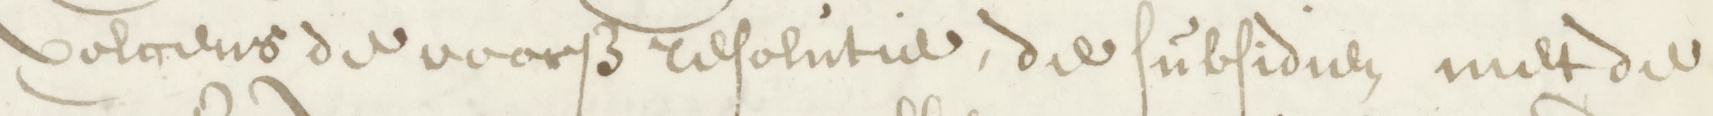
volgens de voors resolutie, de subsidien met de
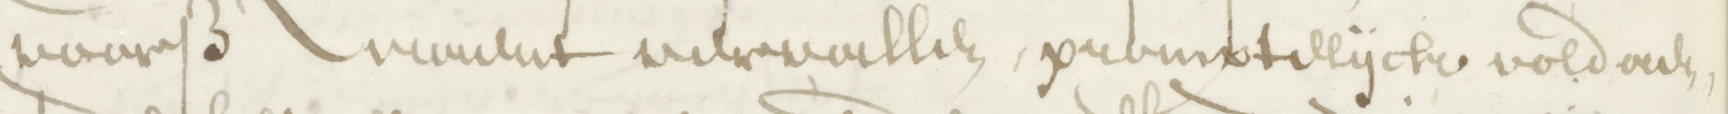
voors maent vervallen, promptelijck voldaen
